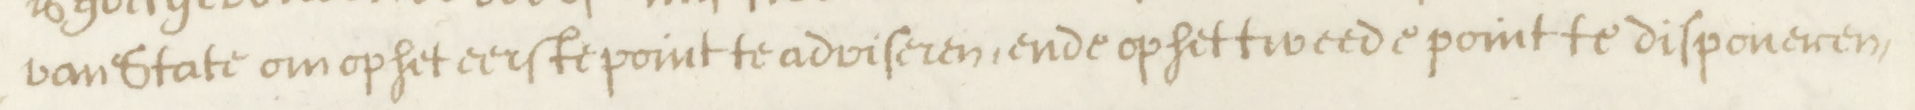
van State om op het eerste point te adviseren, ende op het tweede point te disponeren.
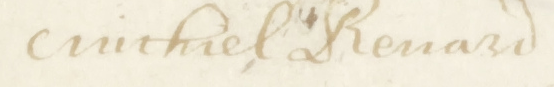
michiel Renard
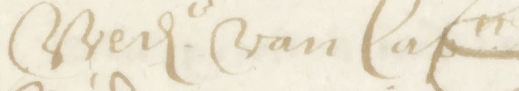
Wede. van Capn.
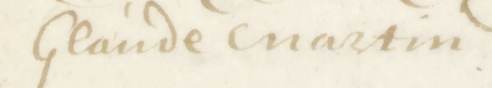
Glaude martin
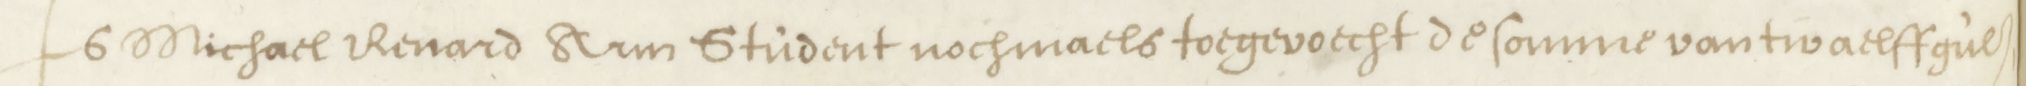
Is Michael Renard Arm Student nochmaels toegevoecht de somme van twaelff gul
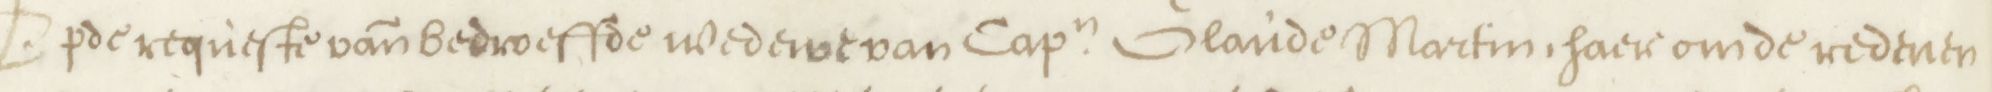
Opde requeste van bedroeffde wedewe van Capn. Glaude Martin, haer om de redenen
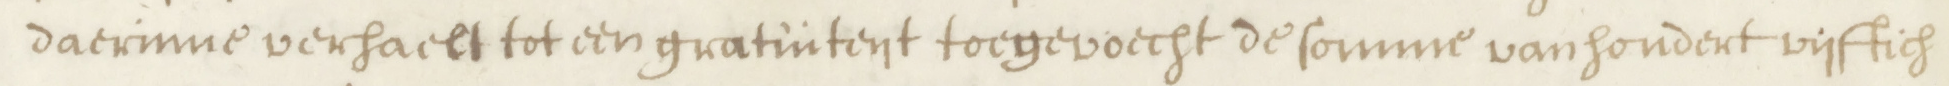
daerinne verhaelt tot een gratuiteyt toegevoecht de somme van hondert vijftich
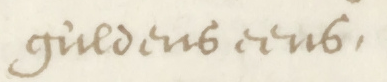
guldens eens.
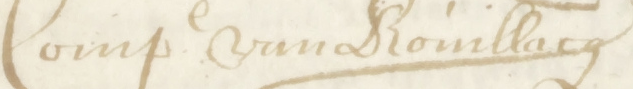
Compe van Rouillacq
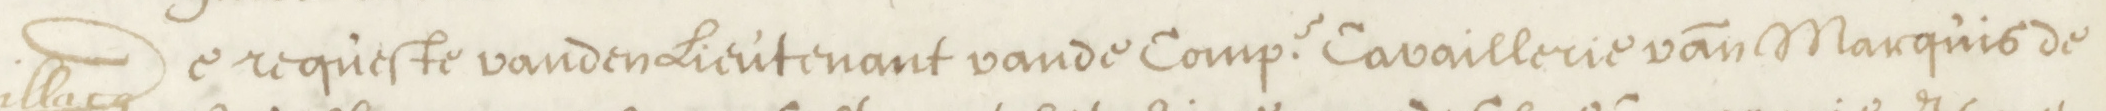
De requeste vanden Lieutenant vande Compe. Cavaillerie van Marquis de
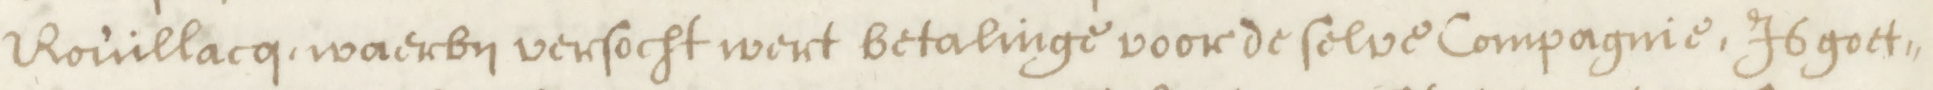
Rouillacq, waerby versocht wert betalinge voor de selve Compagnie. Is goet,,
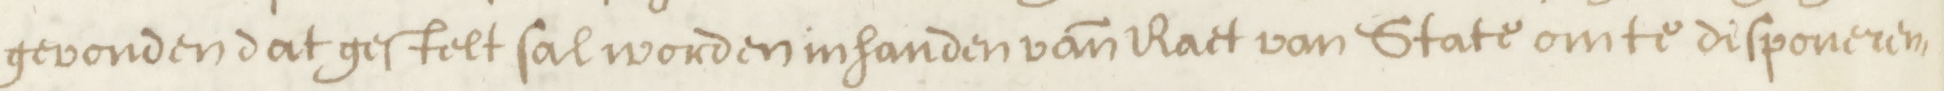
„gevonden dat gestelt sal worden in handen van Raet van State om te disponeren.
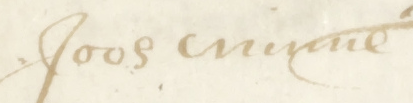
Joos minne
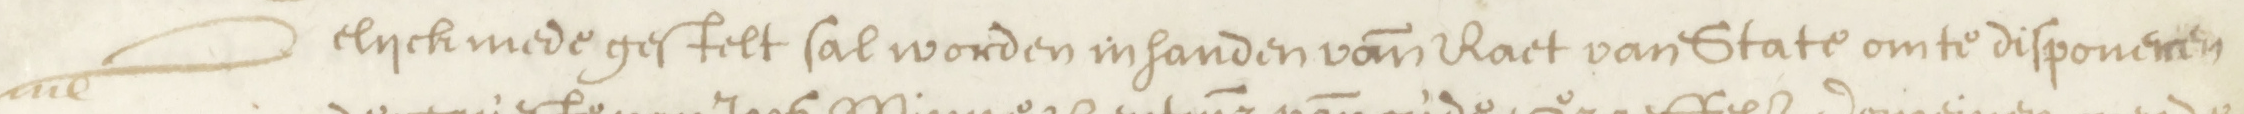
Gelyck mede gestelt sal worden in handen van Raet van State om te disponenen
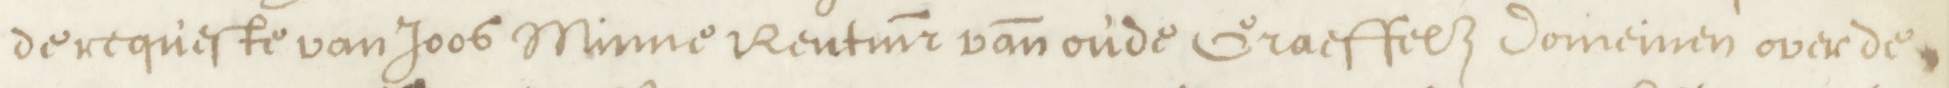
de requeste van Joos Minne Rentmr van oude Graeffel Domeinen over de
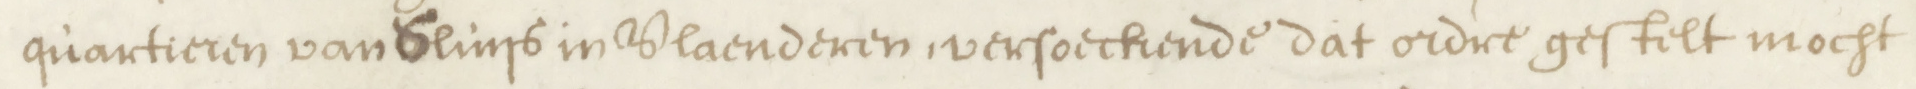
quartieren van Sluys in Vlaenderen, versoeckende dat ordre gestelt mocht
